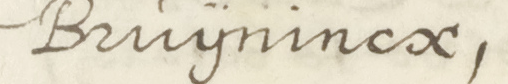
Bruijnincx.
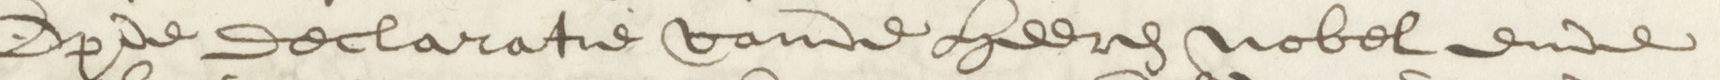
Op de declaratie vande heeren Nobel ende
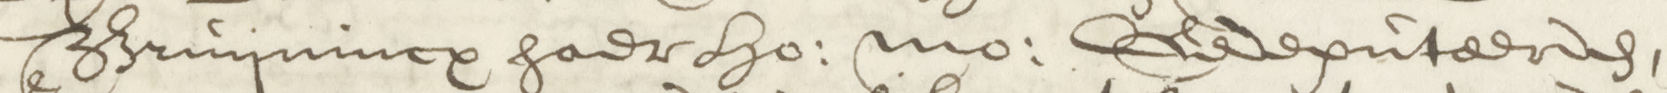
Bruijnincx haer Ho:Mo: Gedeputeerden,
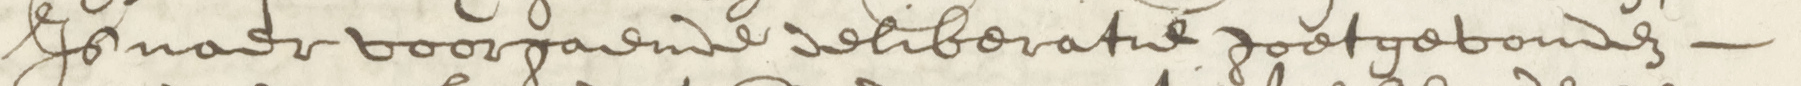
Is naer voorgaende deliberatie goetgevonden —
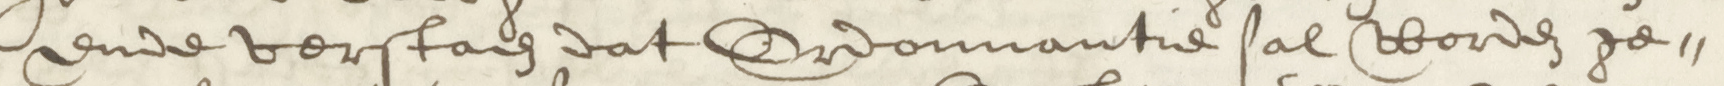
ende verstaen dat Ordonnantie sal worden ge„
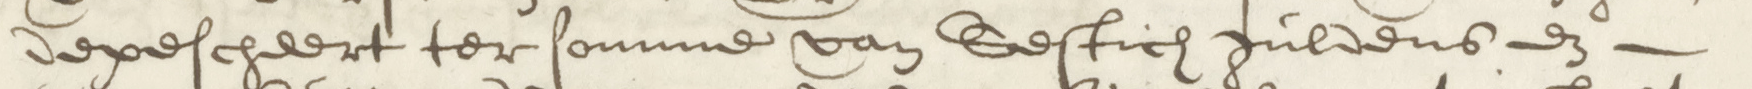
depescheert ter somme van Sestich guldens en —
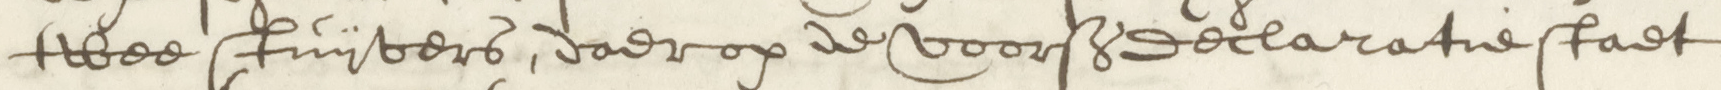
twee stuijvers, daer op de voorsz declaratie staet
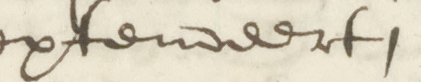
geextendeert.
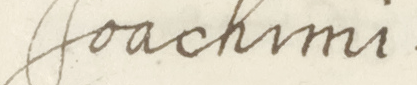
Joachimi.
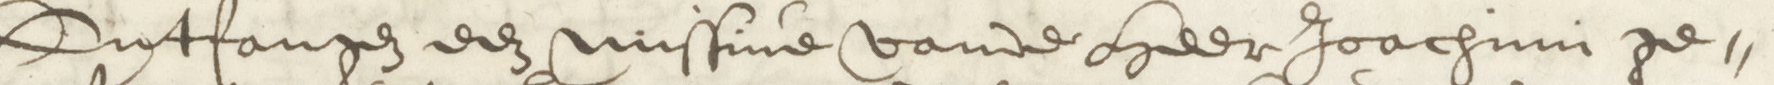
Ontfangen een missive vande heer Joachimi ge„
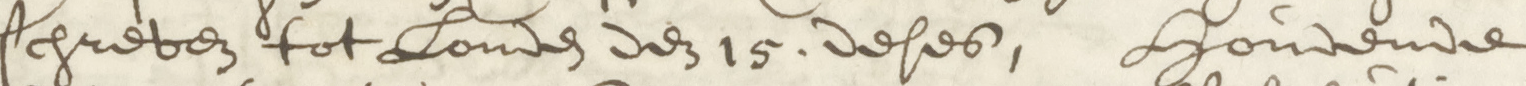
schreven tot Londen den 15. deses, houdende
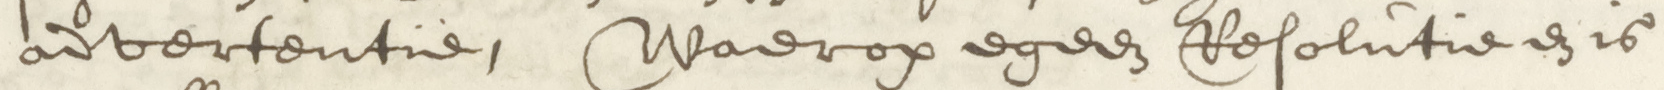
advertentie, Waerop egeen Resolutie en is
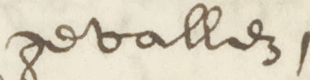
gevallen.
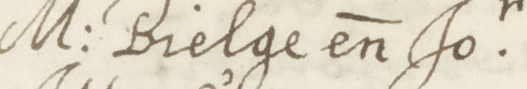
M: Bielge en Jon
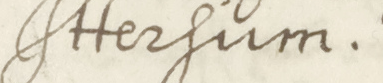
Ittersum.
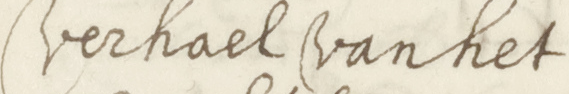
Verhael van het
